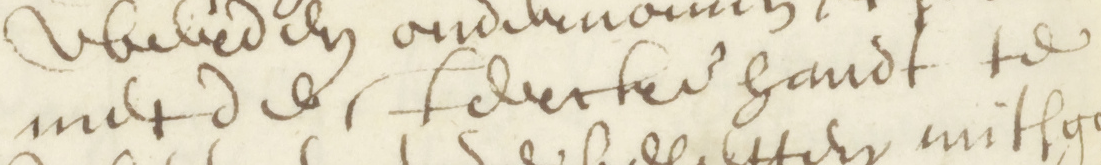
met de stercke handt te
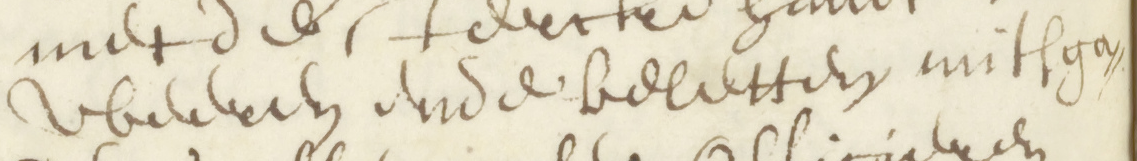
weeren ende beletten, mitsga„
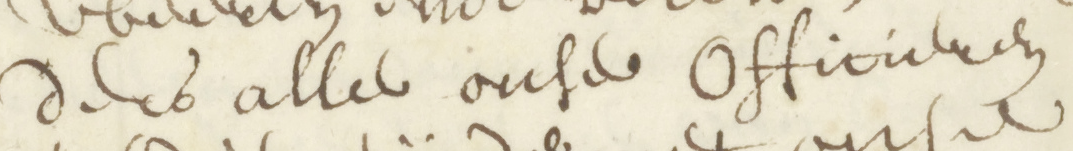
ders alle onse Officieren
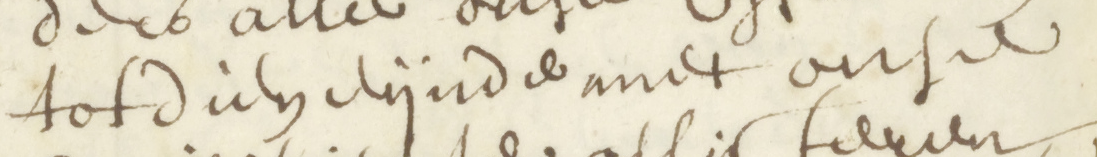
tot dien eijnde met onse
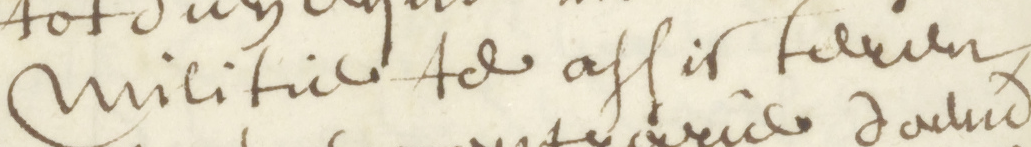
militie te assisteren
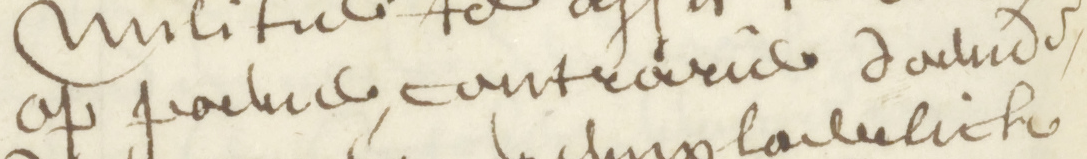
op poene contrarie doende
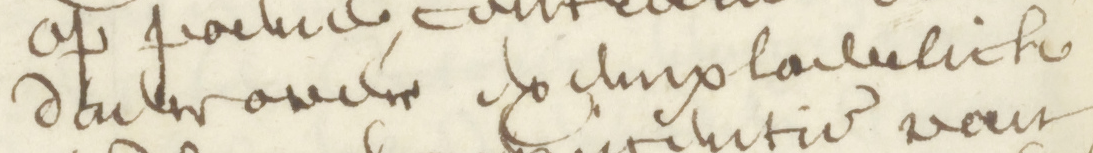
daerover exemplaerlick
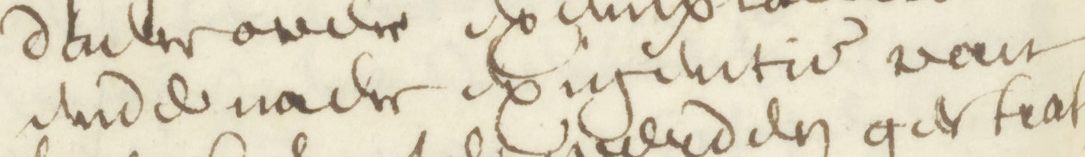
ende naer exigentie van
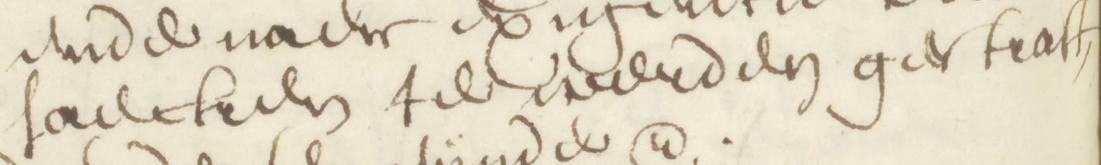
saecken te werden gestraft,
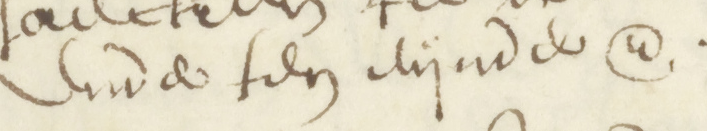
Ende ten eijnde @.
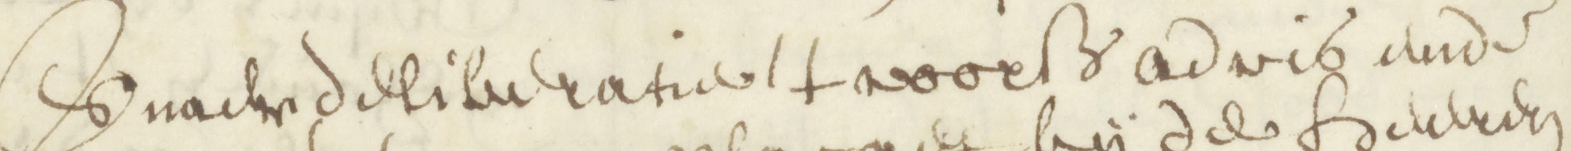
Is naer deliberatie 't voors advis ende
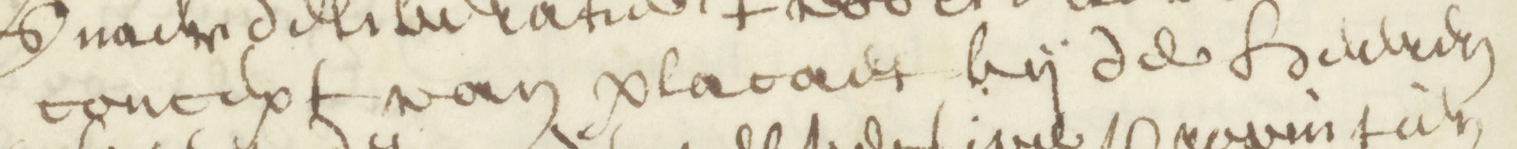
concept van placaet bij de Heeren
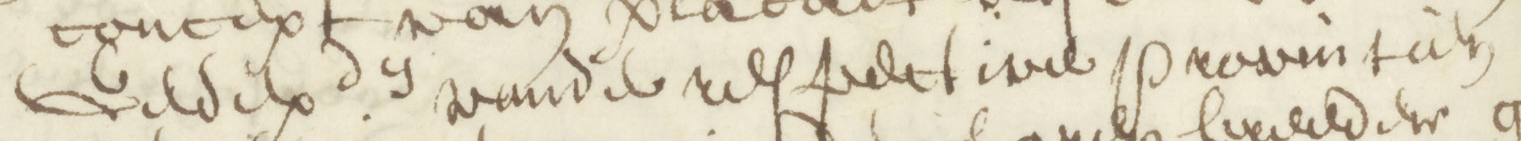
Gedepden. vande respective provintien
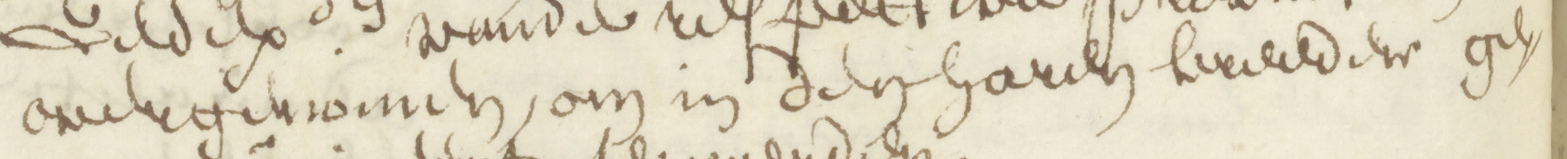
overgenomen, om in den haren breeder ge„
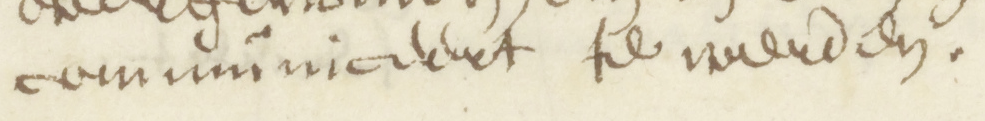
comuniceert te werden.
